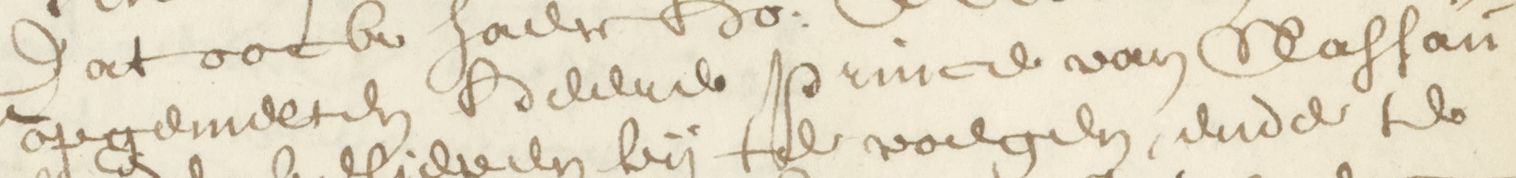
opgemelten Heere Prince van Nassau
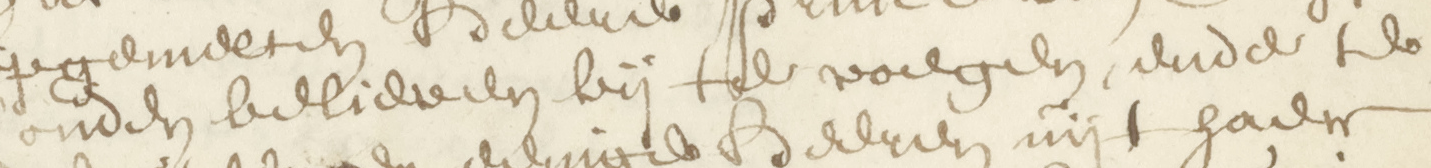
souden believen bij te voegen, ende te
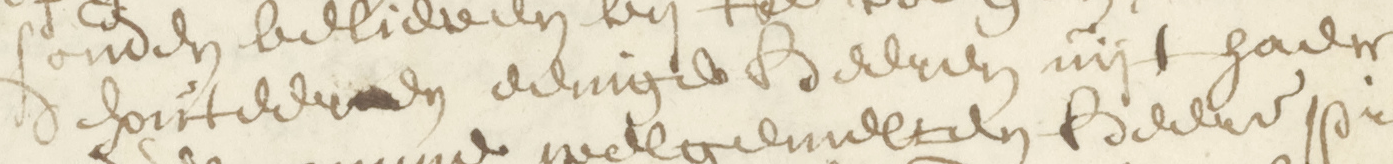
deputeeren eenige Heeren uijt haer
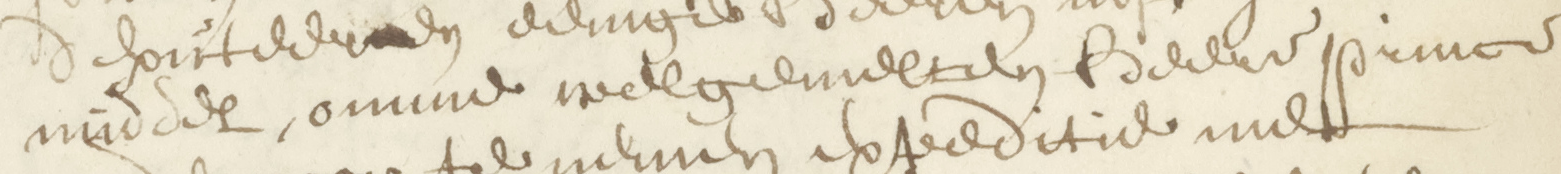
middel, omme welgemelten Heere Prince
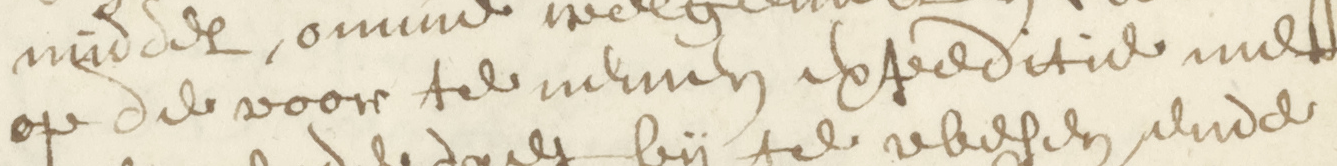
op de voor te nemen expeditie met
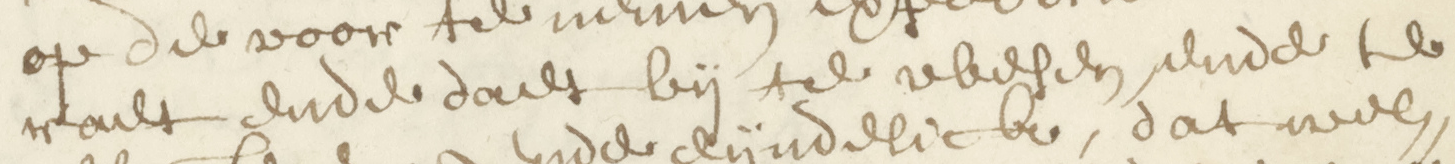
raet ende daet bij te wesen, ende te
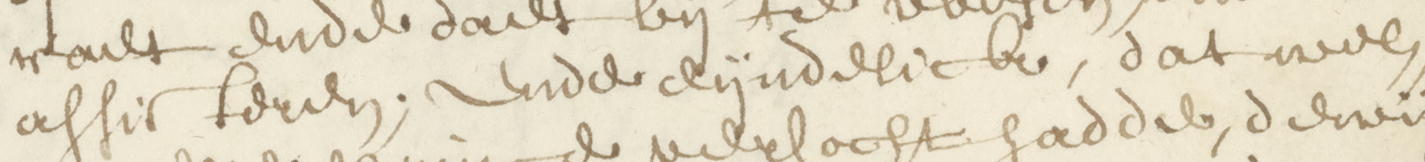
assisteren; ende eijndelick, dat wel„
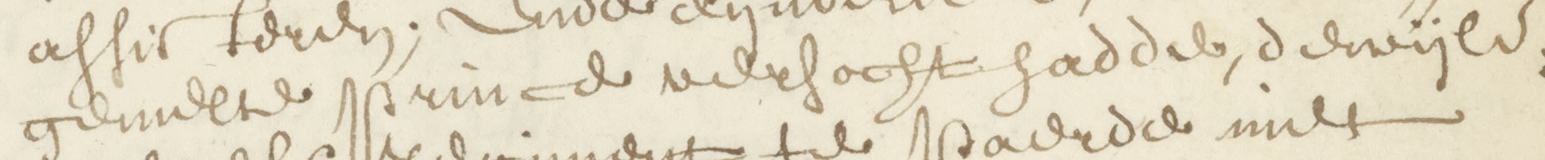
gemelte Prince versocht hadde, dewijle
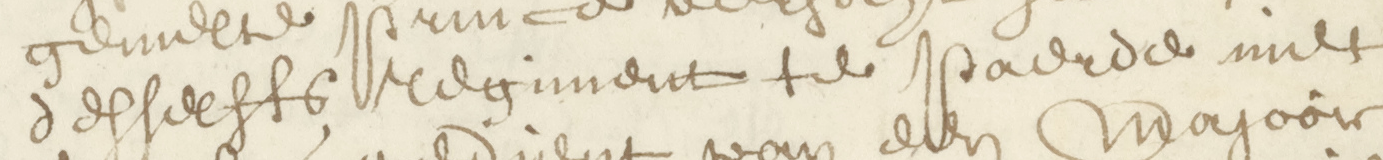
desselffs regiment te Paerde niet
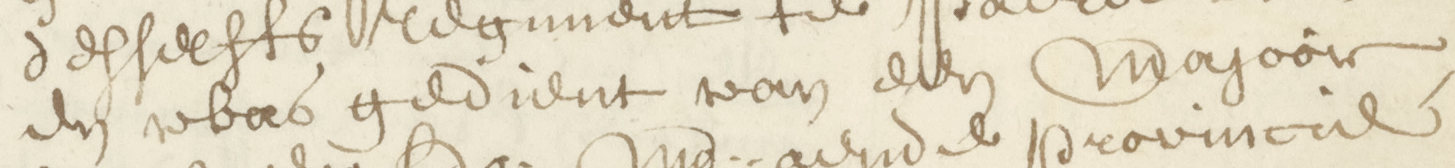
en was gedient van een Majoor
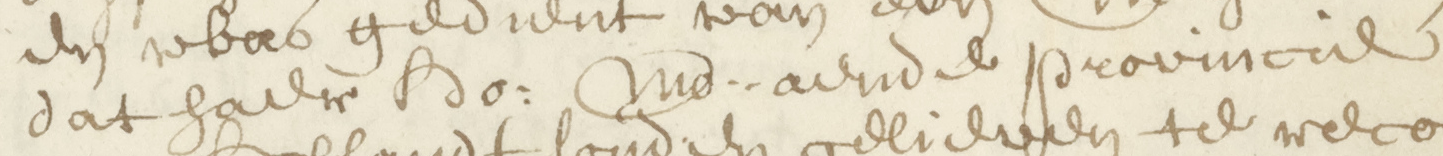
dat haer Ho:Mo: aende Provincie
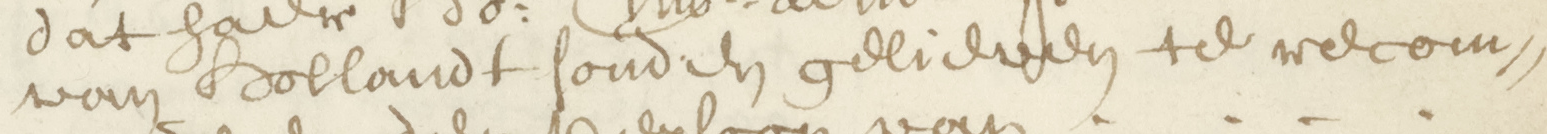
van Hollandt souden gelieven te recom„
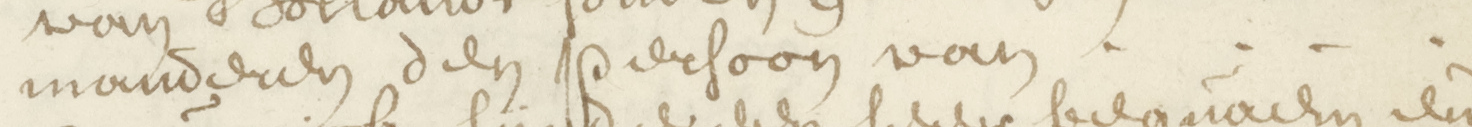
manderen den persoon van - - -
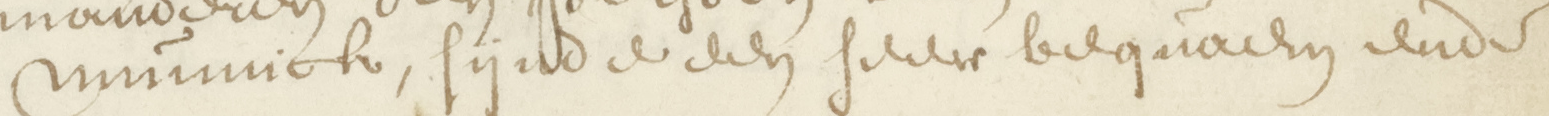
Muninck, sijnde een seer bequaem ende
